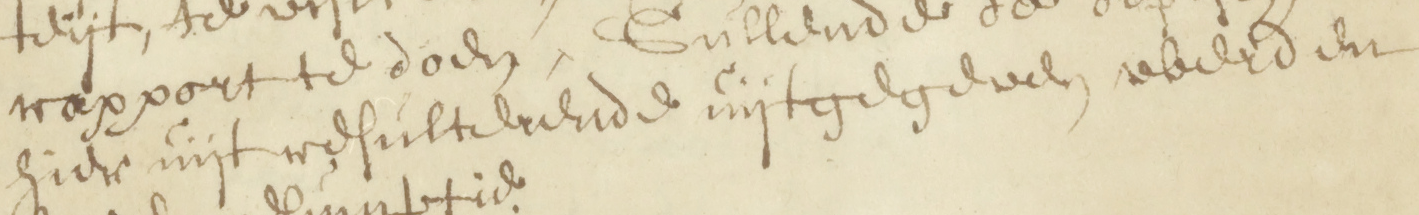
hier uijt resulterende uijtgegeven werden
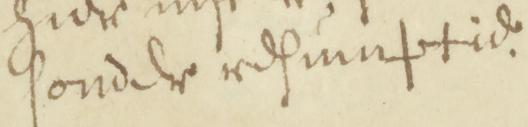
sonder resumptie.
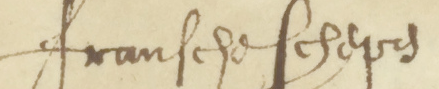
Fransche schepen
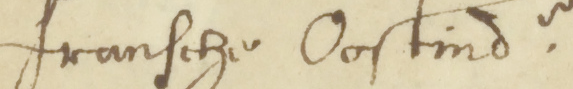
Fransche Oostinde.
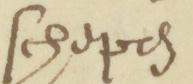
schepen
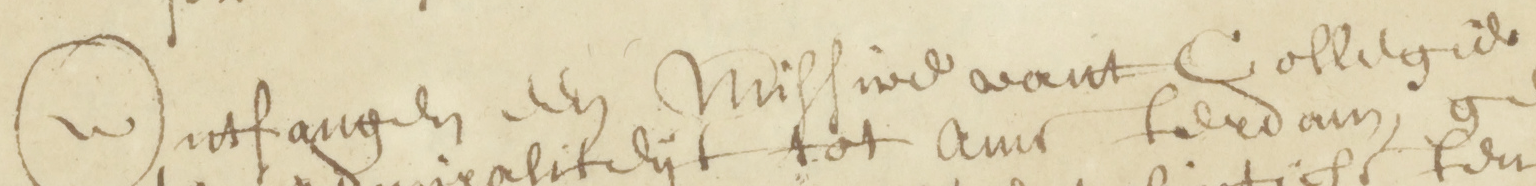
Ontfangen een Missive vant Collegie
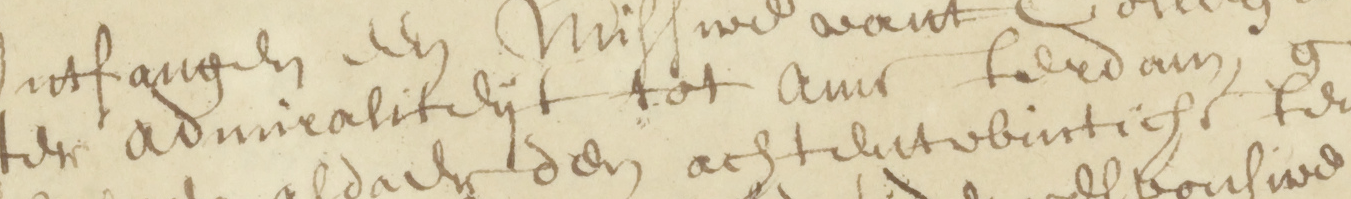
ter Admiraliteijt tot Amsterdam, ge„
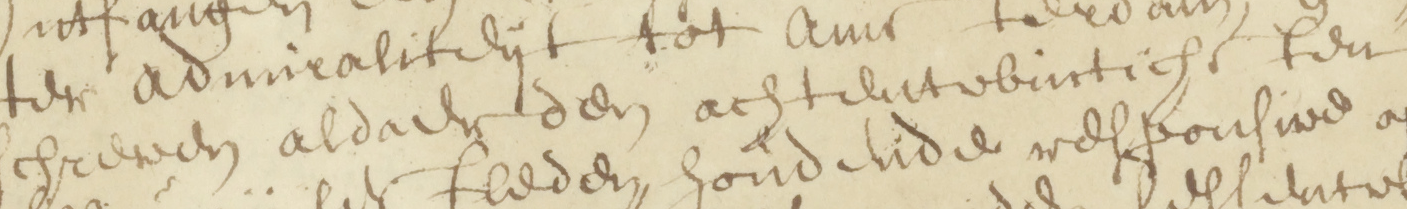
schreven aldaer den achtentwintichsten
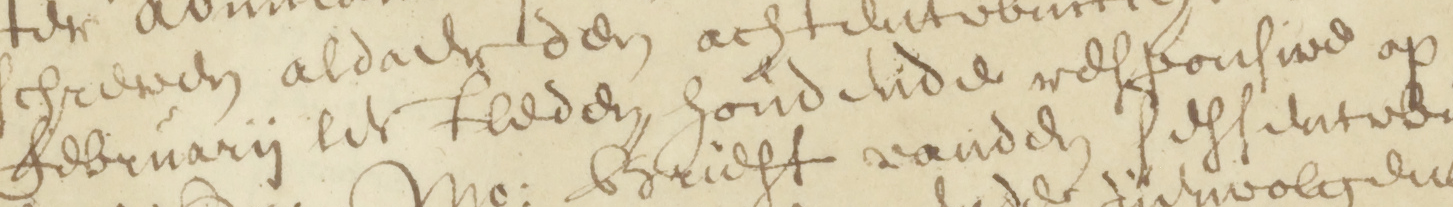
februarij lestleden, houdende responsive op
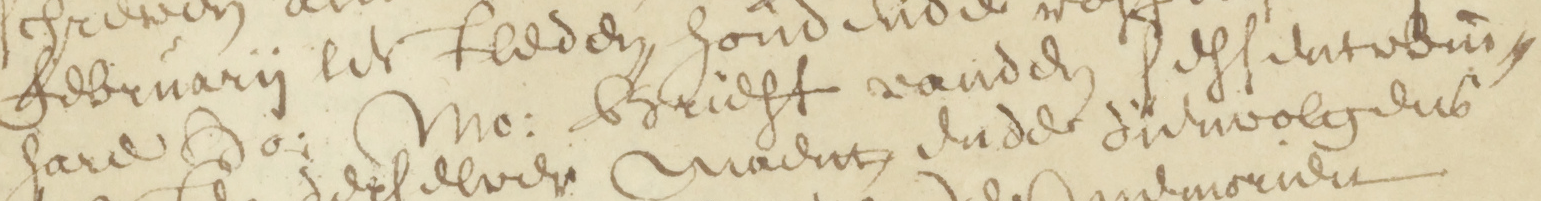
hare Ho:Mo: Brieff vanden sessentwin„
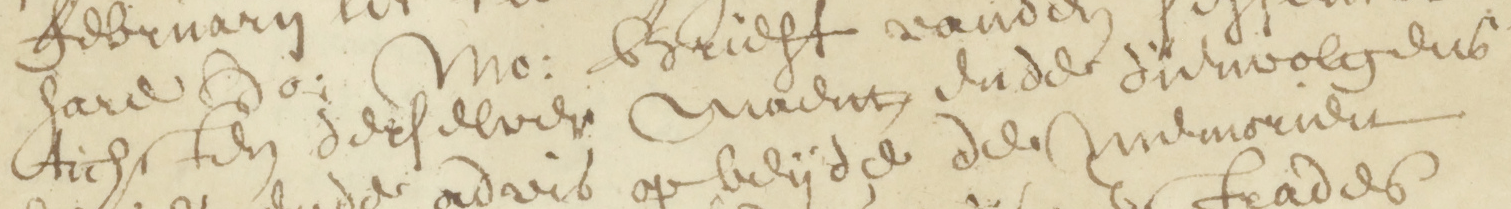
tichsten derselver maent, ende dienvolgens
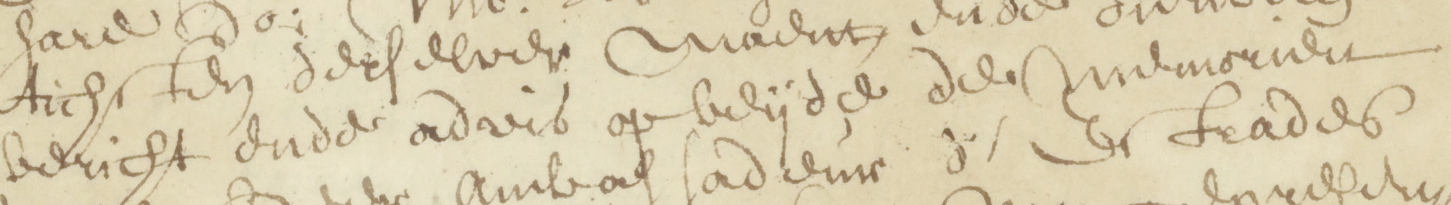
bericht ende advis op beijde de memorien
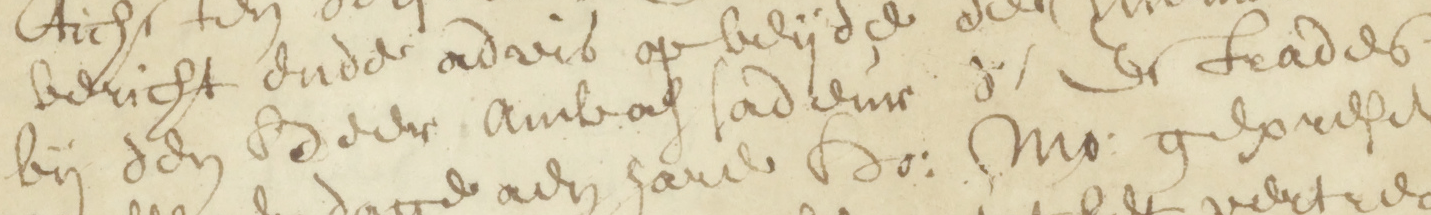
bij den Heer Ambassadeur d‛ Estrades
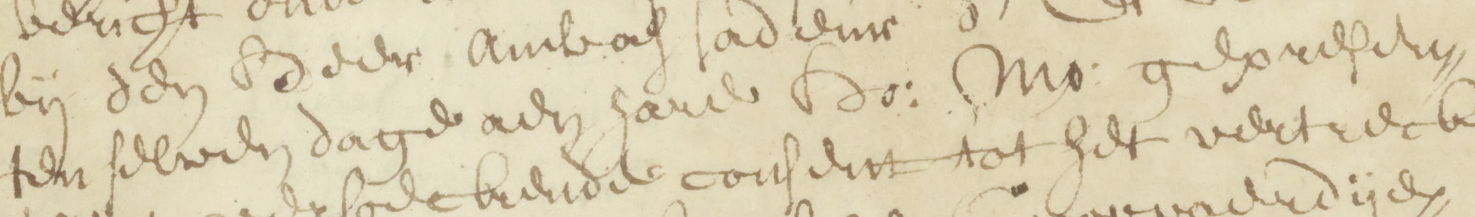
ten selven dage aen hare Ho:Mo: gepresen„
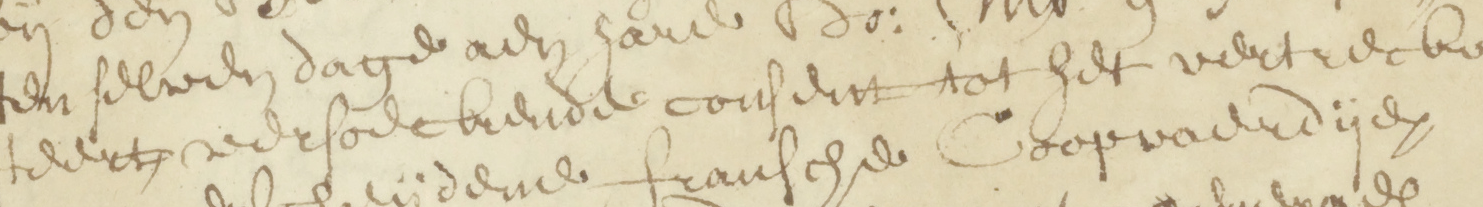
teert, versoeckende consent tot het vertreck
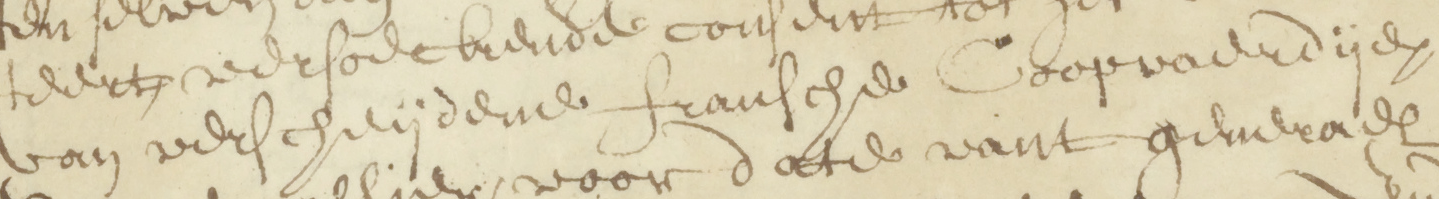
van verscheijdene fransche Coopvaerdije„
